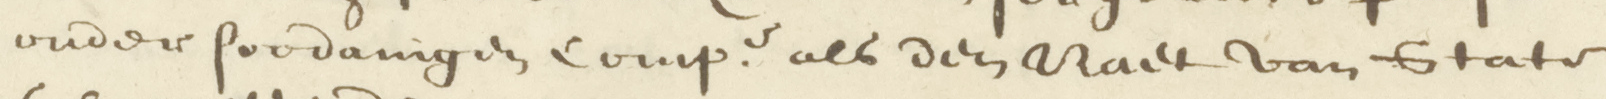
onder soodanigen Compe als den Raet van State
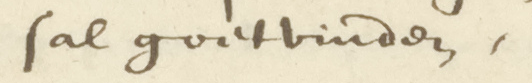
sal goetvinden.
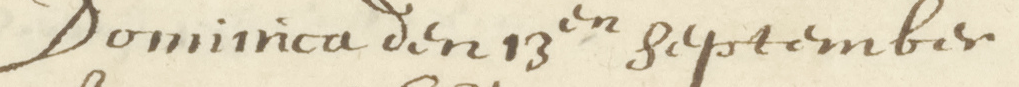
Dominica den 13en september
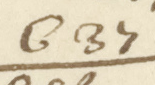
1637
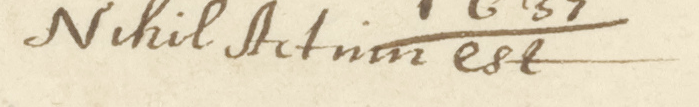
Nihil Actum est
